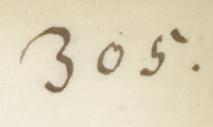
305
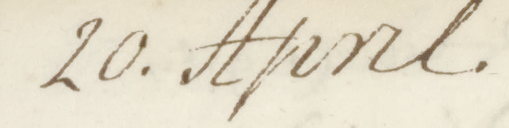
20. April.
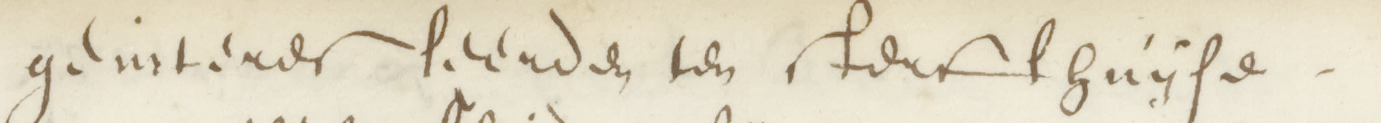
geinteresseerden ten sterffhuijse
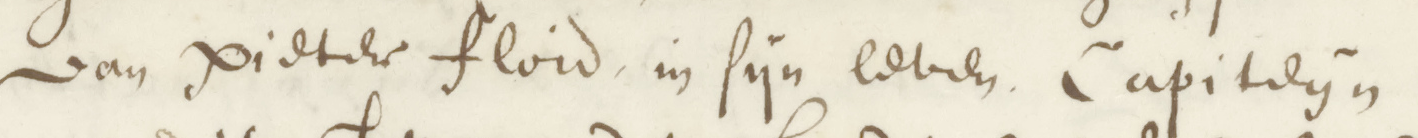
van Pieter Floid, in sijn leven Capiteijn
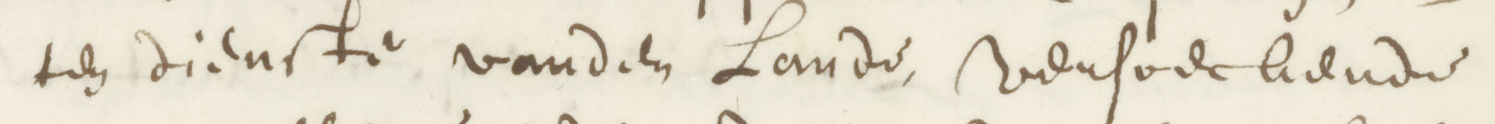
ten dienste vanden Lande, versoeckende
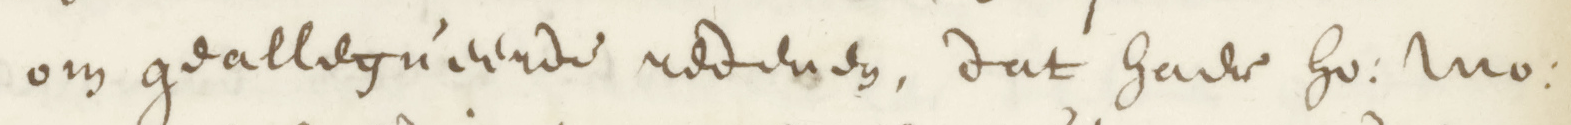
om geallegueerde redenen, dat haer Ho:Mo:
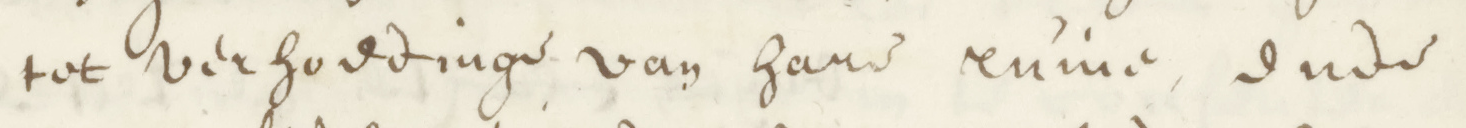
tot verhoedinge van hare ruine, ende
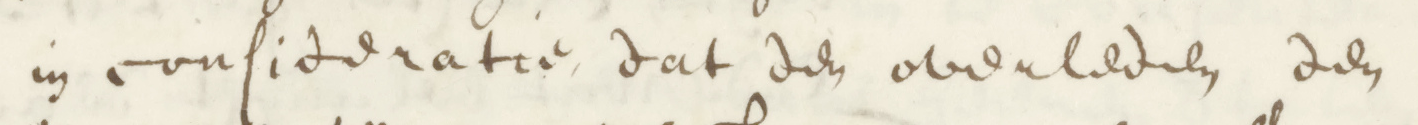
in consideratie dat den overleden den
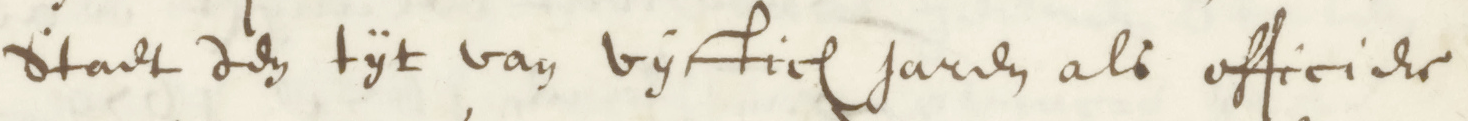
Staet den tijt van vijftich jaren als officier
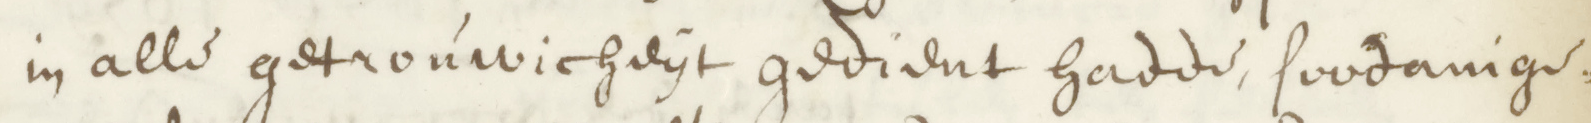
in alle getrouwicheijt gedient hadde, soodanige
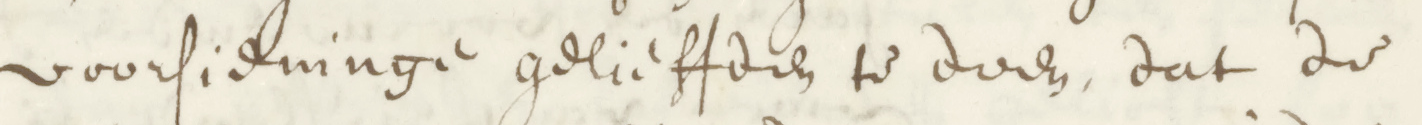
voorsieninge gelieffden te doen, dat de
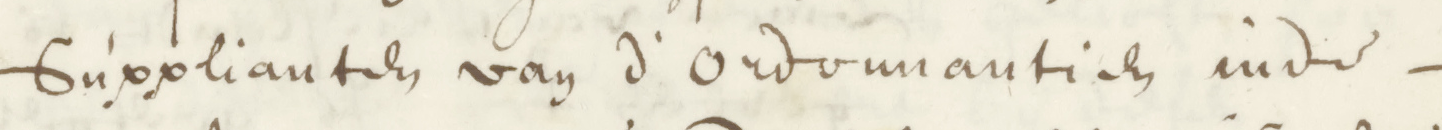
Supplianten van d'Ordonnantien inde
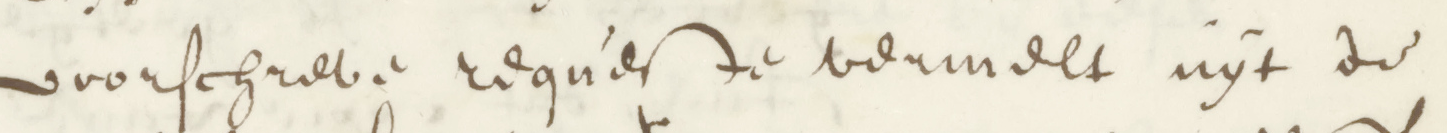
voorschreve requeste vermelt uijt de
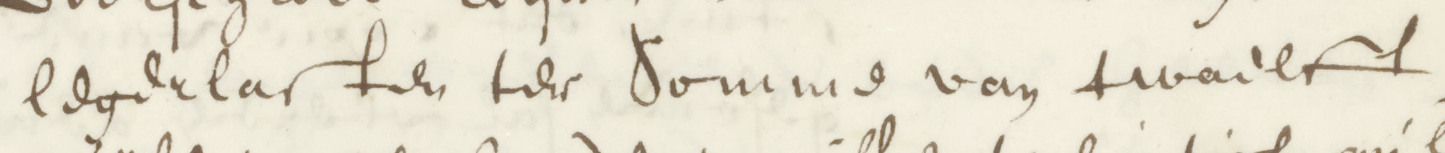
legerlasten ter Somme van twaelff
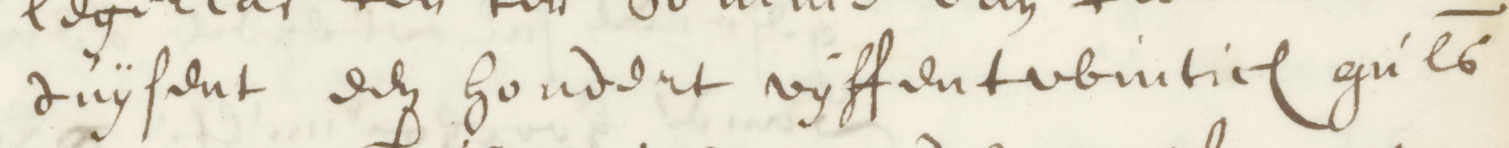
duijsent een hondert vijffentwintich guls
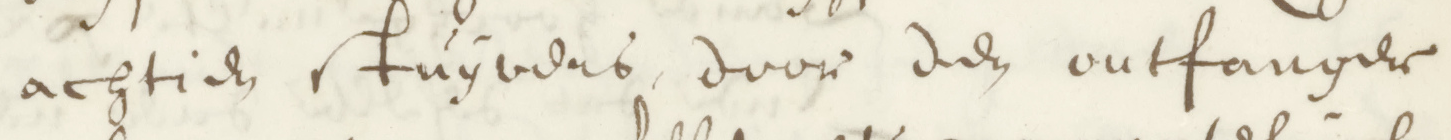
achtien stuyvers door den ontfanger
